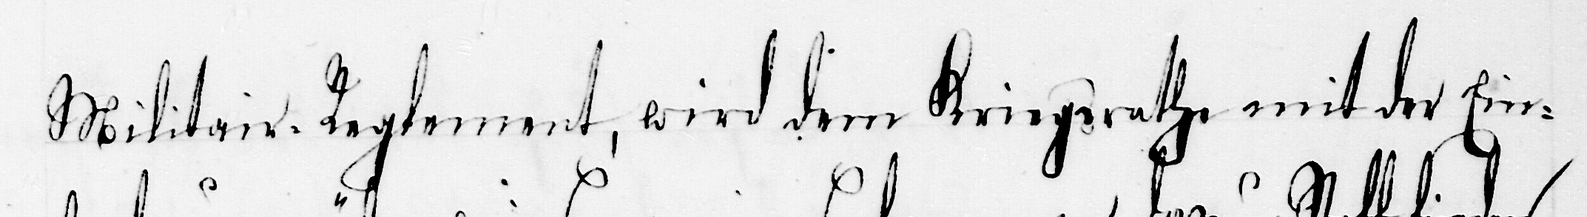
Militair-Reglement, wird dem Kriegsrathe mit der Ein¬
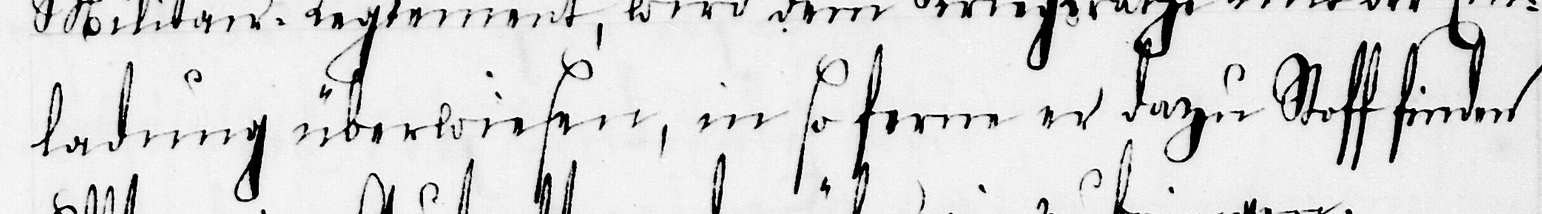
ladung überwiesen, in so ferne er dazu Stoff finden
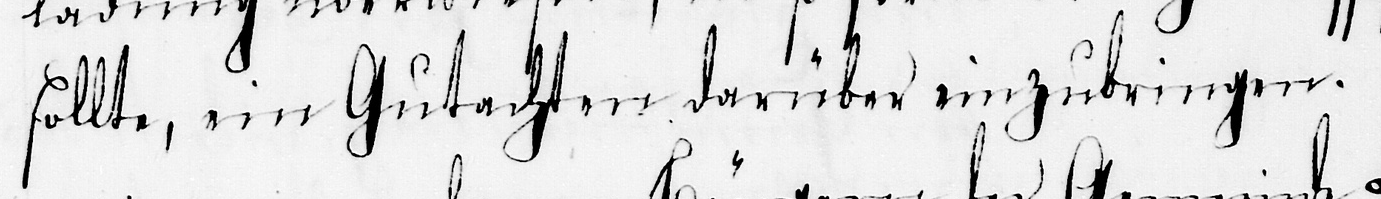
sollte, ein Gutachten darüber einzubringen.
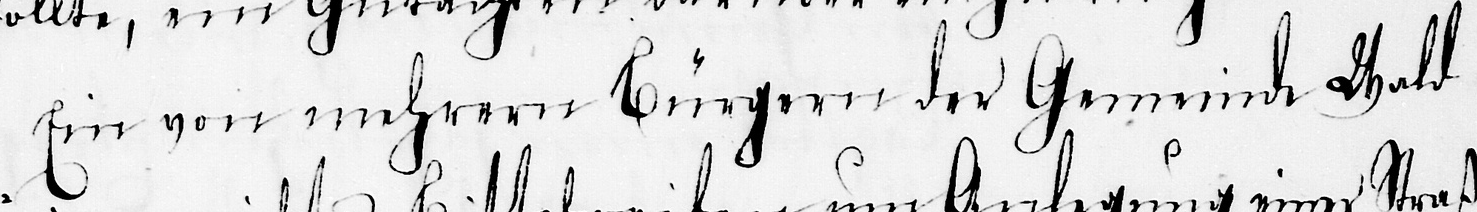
Ein von mehrern Bürgern der Gemeinde Wald
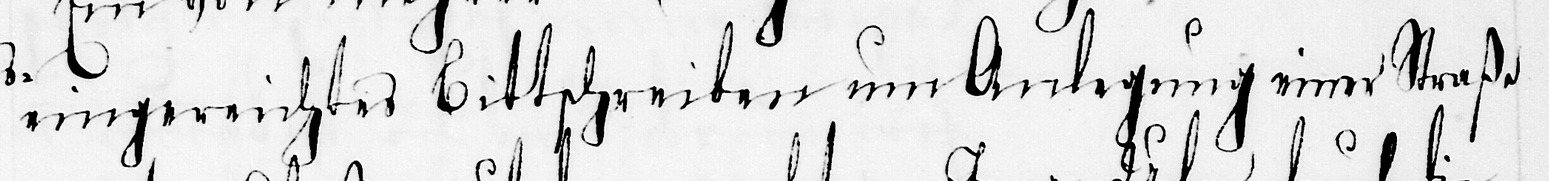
eingereichtes Bittschreiben um Anlegung einer Straße
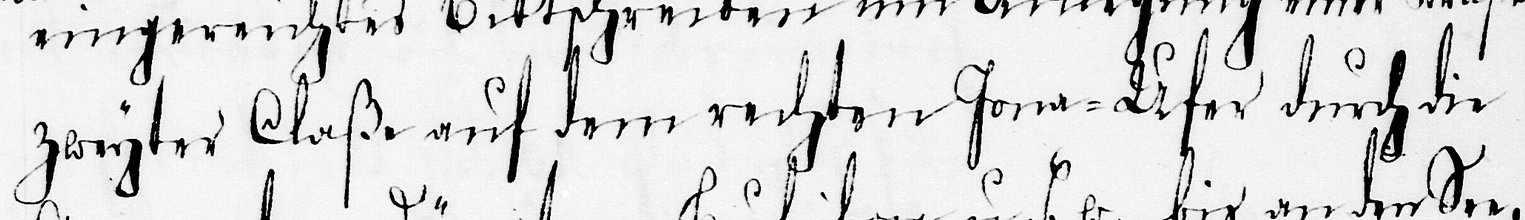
zweyter Claße auf dem rechten Jona-Ufer durch die
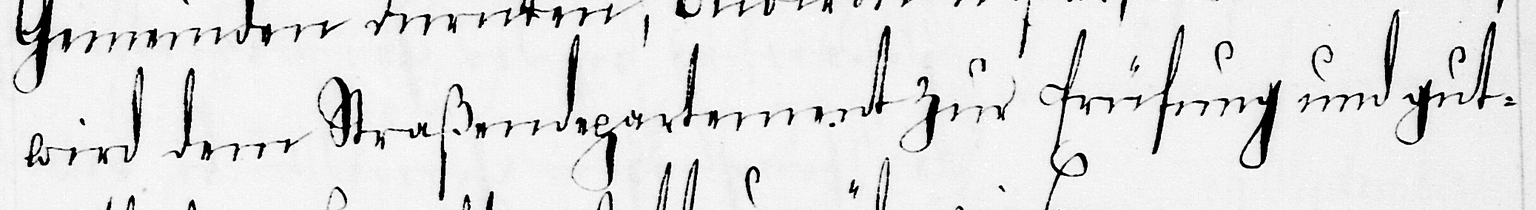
wird dem Straßendepartement zur Prüfung und gut¬
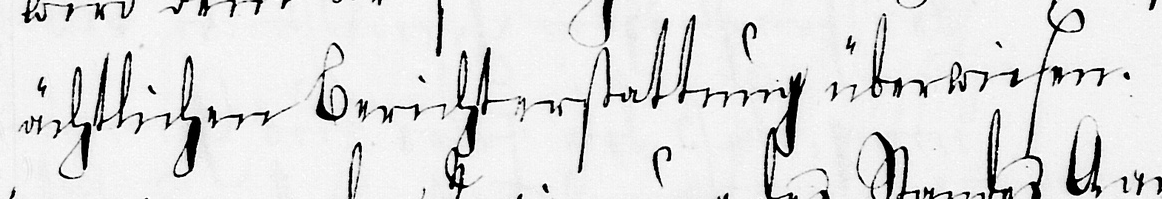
ächtlichen Berichterstattung überwiesen.
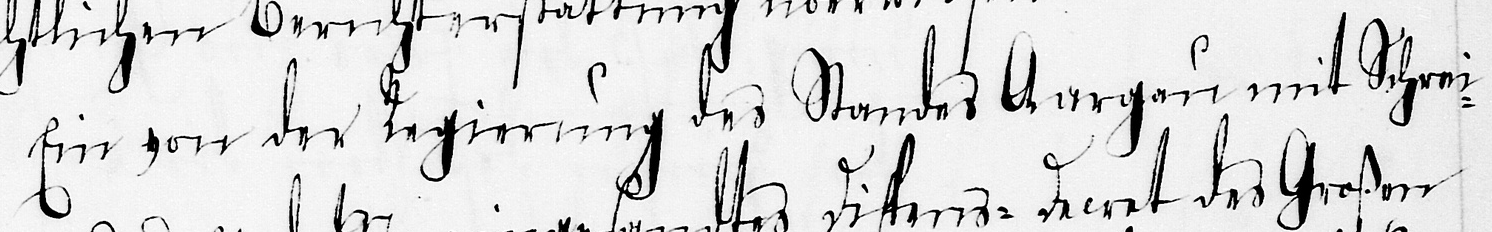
Ein von der Regierung des Standes Aargau mit Schrei¬
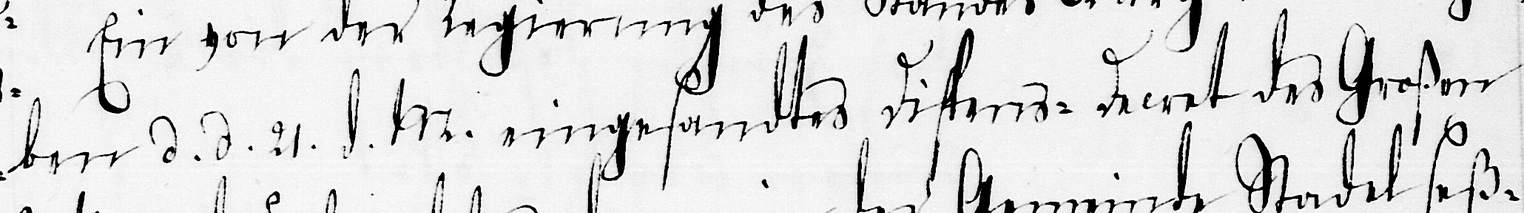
ben d. d. 21. d. M. eingesandtes Dispens-Decret des Großen
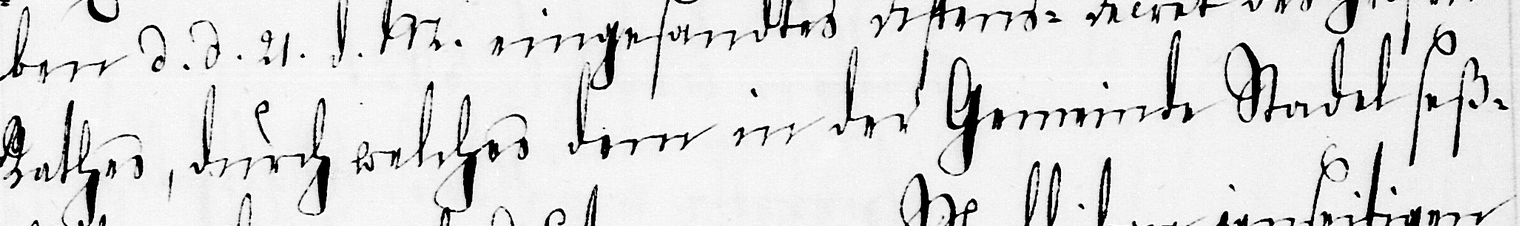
Rathes, durch welches dem in der Gemeinde Stadel seß¬
